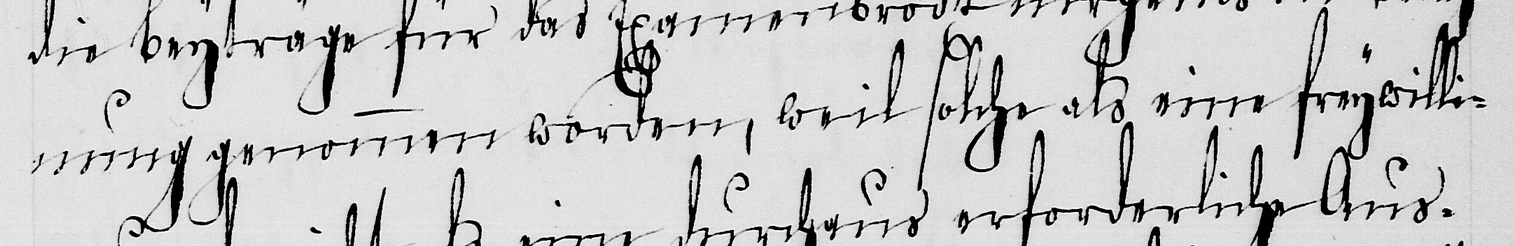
nung genommen worden, weil solche als eine freywilli¬
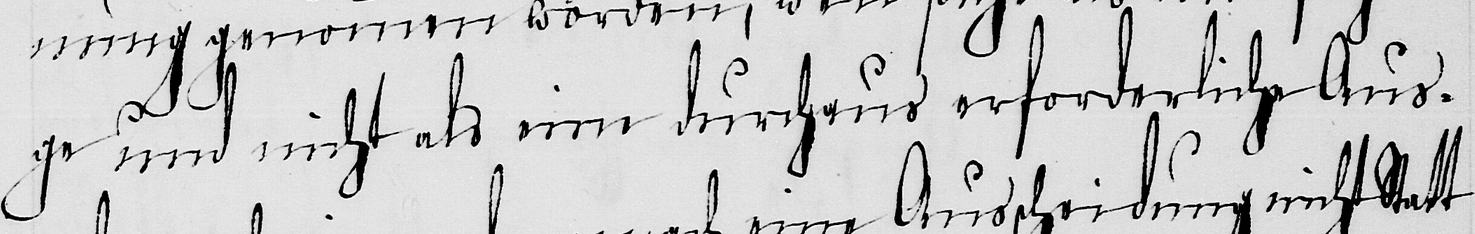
ge und nicht als eine durchaus erforderliche Aus¬
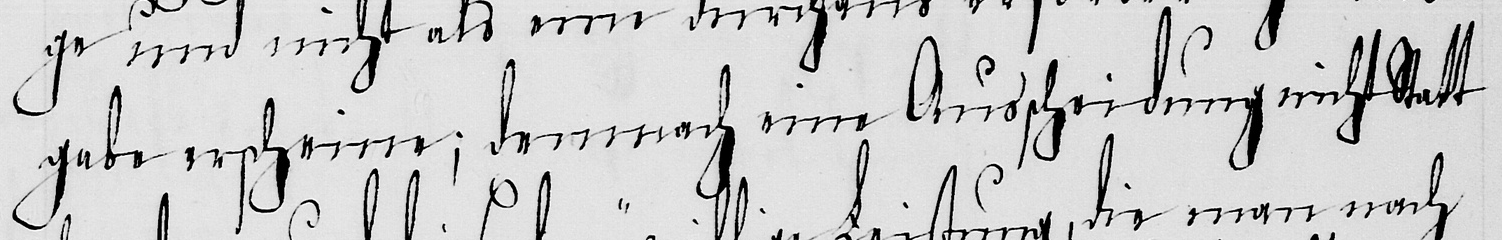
gabe erscheine; demnach eine Ausscheidung nicht Statt
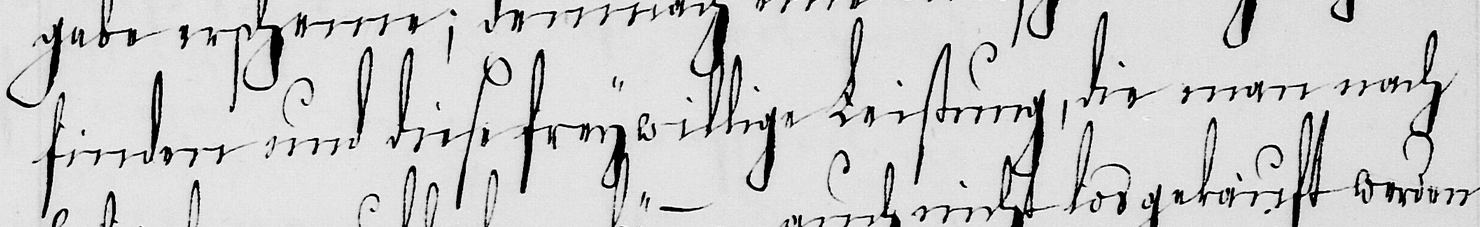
finden und diese freywillige Leistung, die man nach
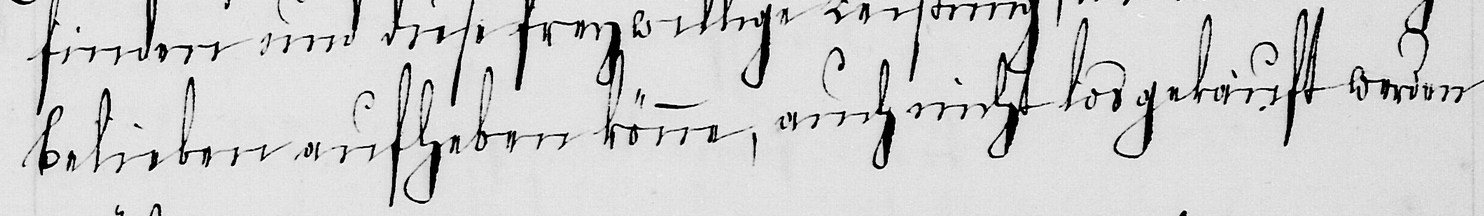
belieben aufheben könne, auch nicht losgekauft werden
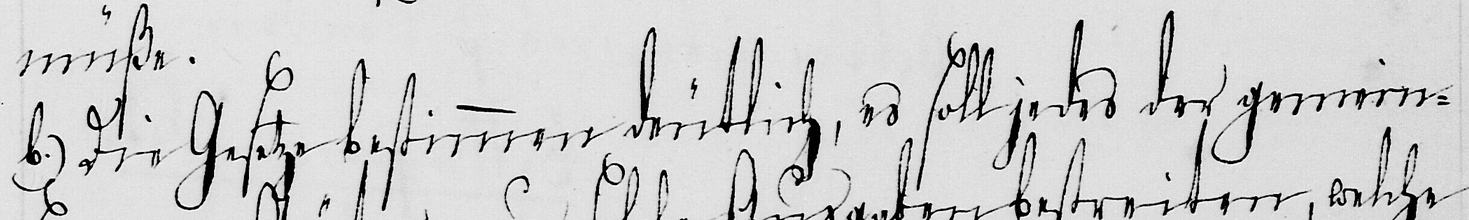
Die Gesetze bestimmen deutlich, es soll jedes der gemein¬
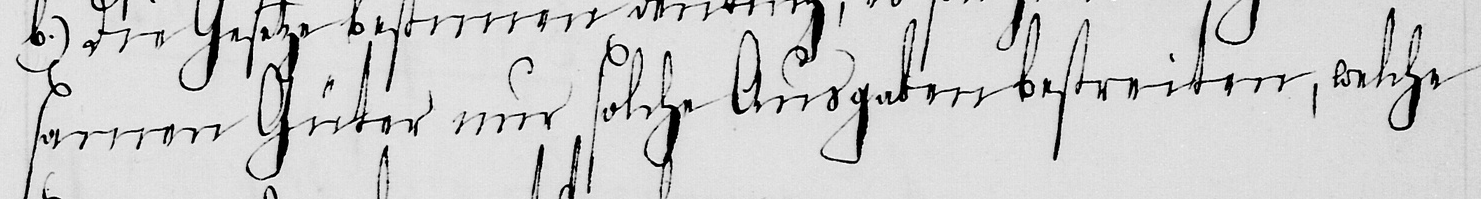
samen Güter nur solche Ausgaben bestreiten, welche
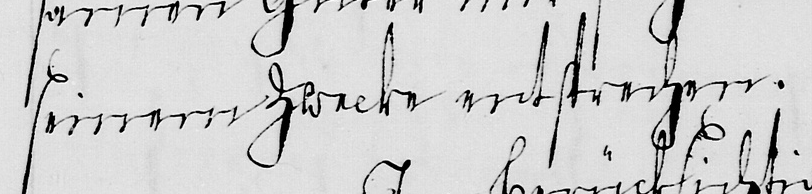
seinem Zwecke entsprechen.
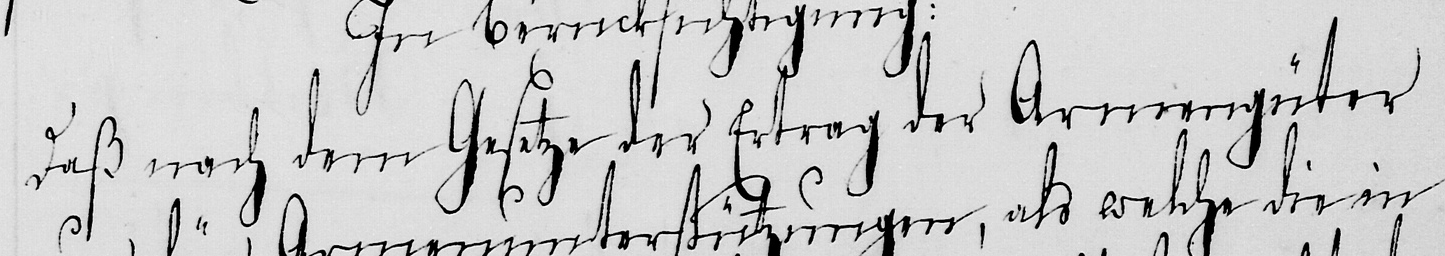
Daß nach dem Gesetze der Ertrag der Armengüter
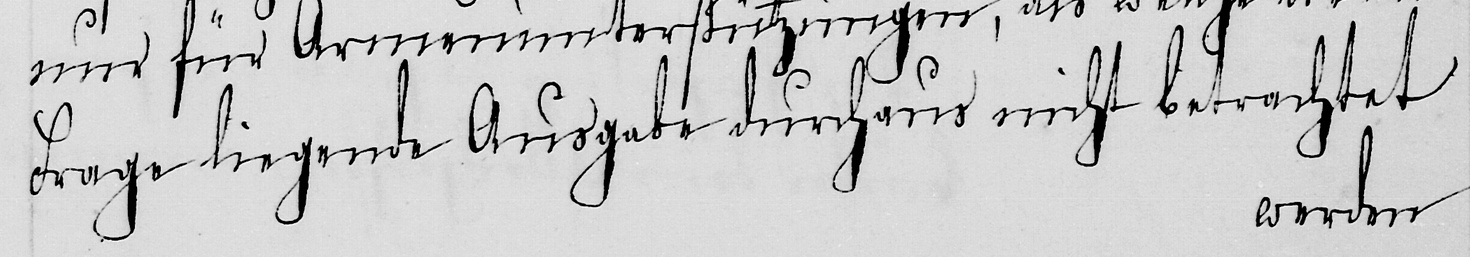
Frage liegende Ausgabe durchaus nicht betrachtet
